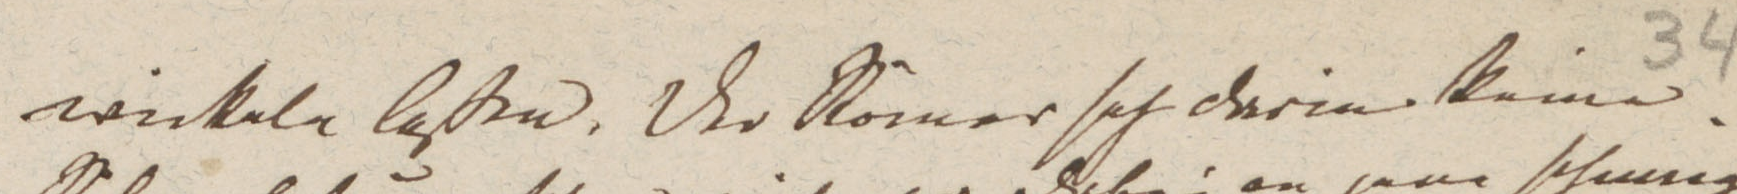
wickeln lassen. Der Römer sah darin keine
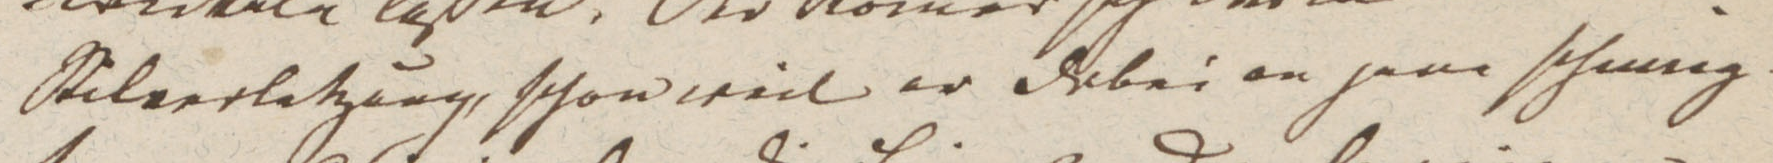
Stilverletzung, schon weil er dabei an jene schmieg-
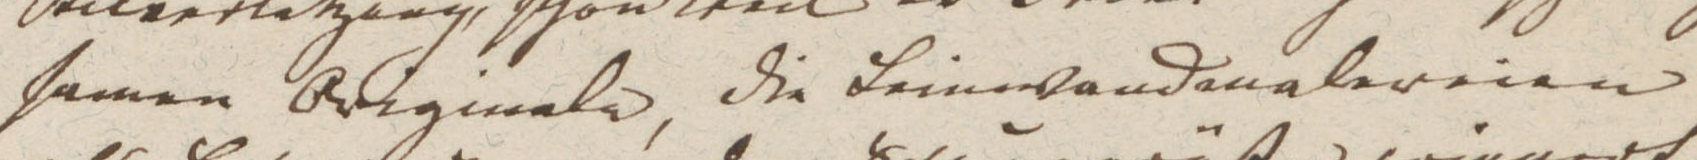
samen Originale, die Leinwandmalereien
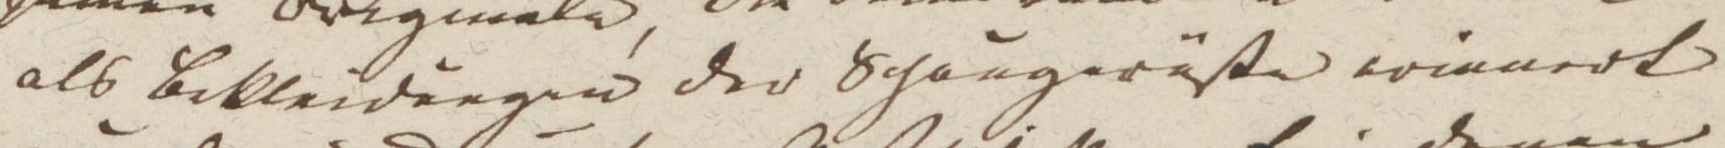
als Bekleidungen der Schaugerüste erinnert
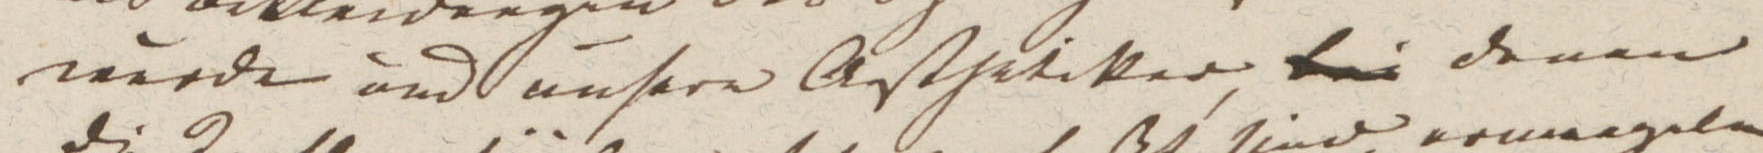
wurde und unsere Aesthetiker, bei denen
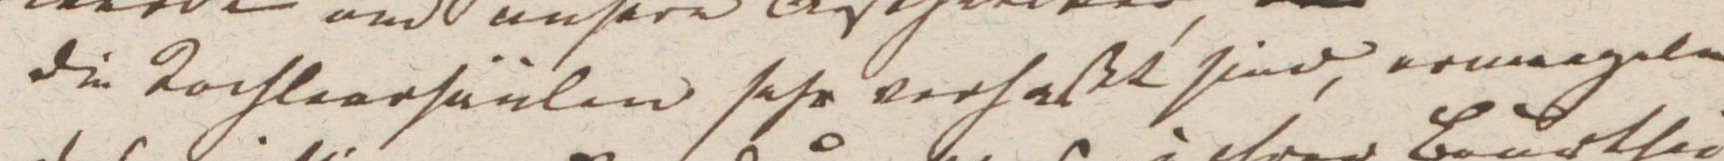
die Kochlearsäulen sehr verhasst sind, ermangeln
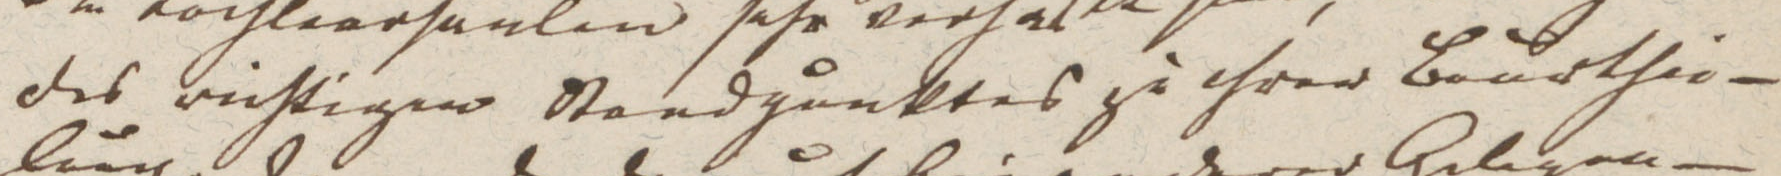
des richtigen Standpunktes zu ihrer Beurthei-
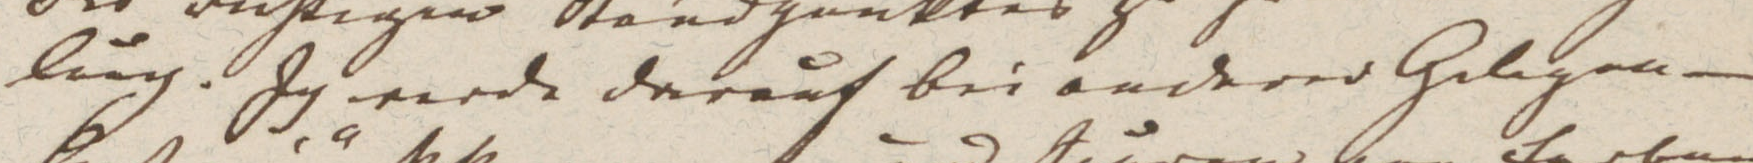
lung. Ich werde darauf bei anderer Gelegen-
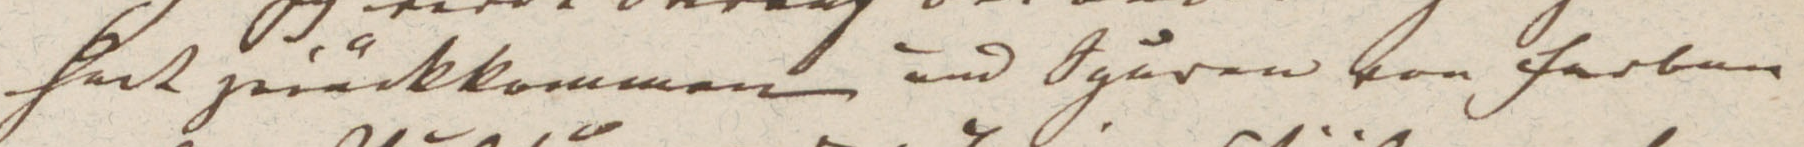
heit zurückkommen und Spuren von Farben
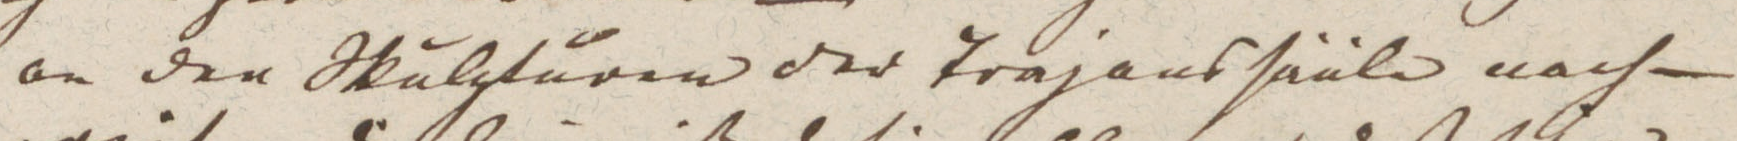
an den Skulpturen der Trajanssäule nach-
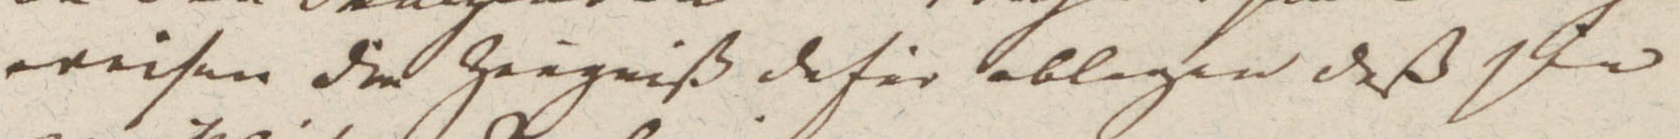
weisen die Zeugniss dafür ablegen dass sie
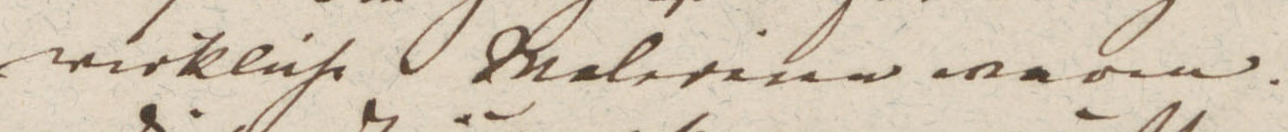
wirkliche Malereien waren.
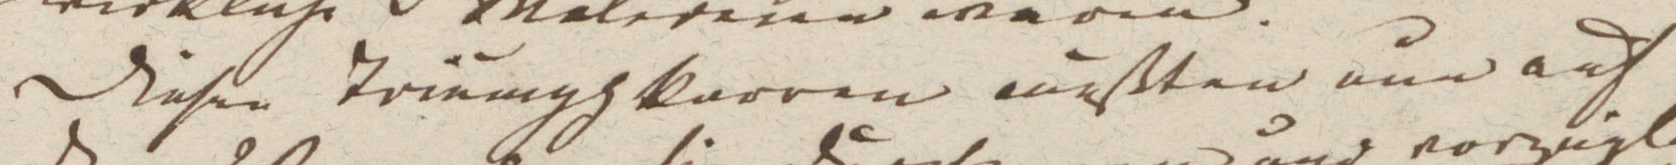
Diesen Triumphkarren mussten nun auf
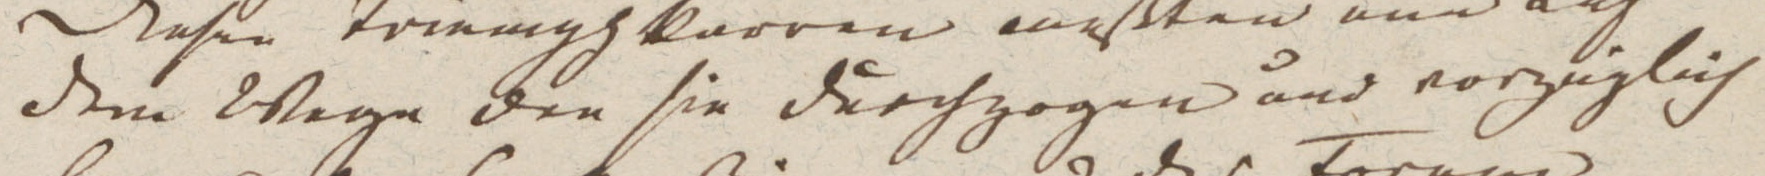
dem Wege den sie durchzogen und vorzüglich
